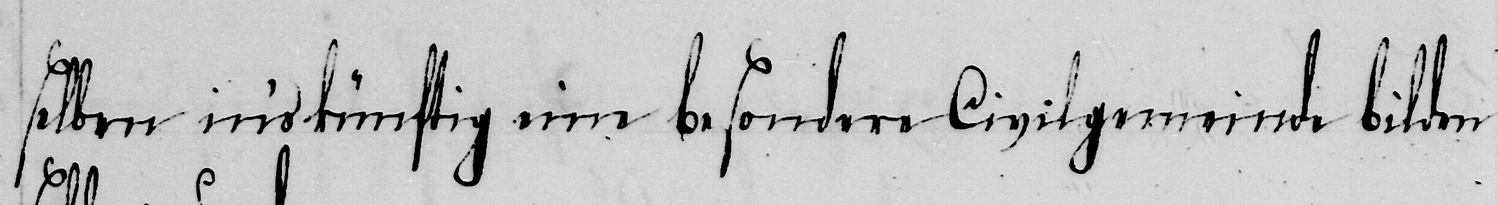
selben ins’künftig eine besondere Civilgemeinde bilden
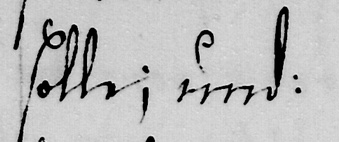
solle; und:
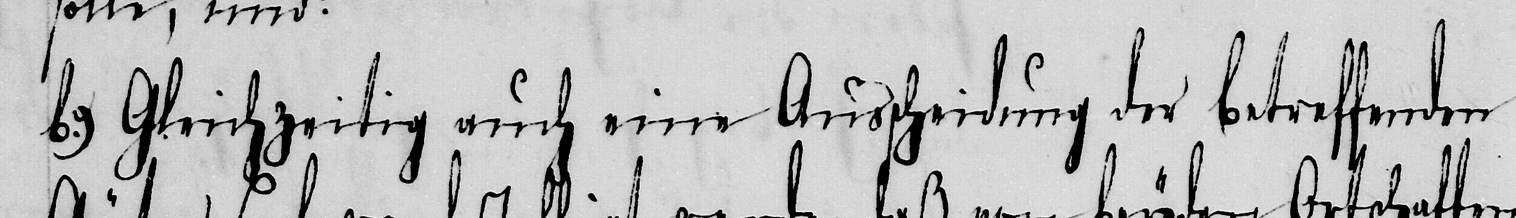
b.) Gleichzeitig auch eine Ausscheidung der betreffend¬
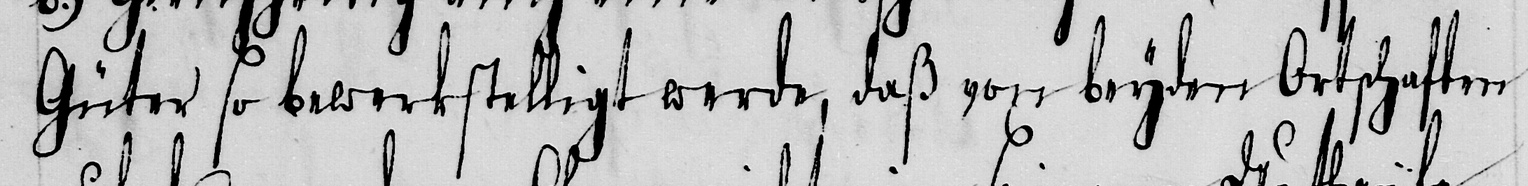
Güter so bewerkstelligt werde, daß von beyden Ortschaften
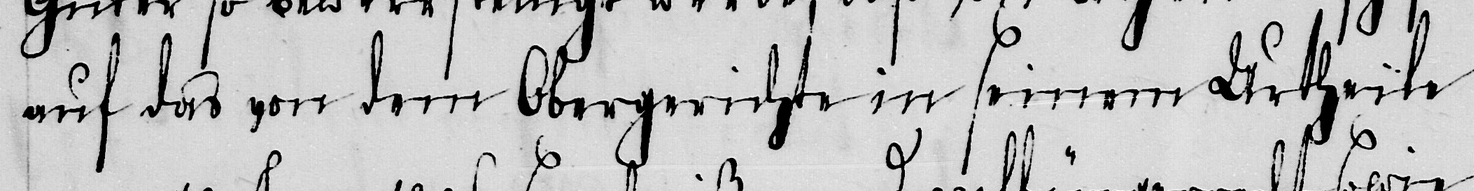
auf das von dem Obergerichte in seinem Urtheile
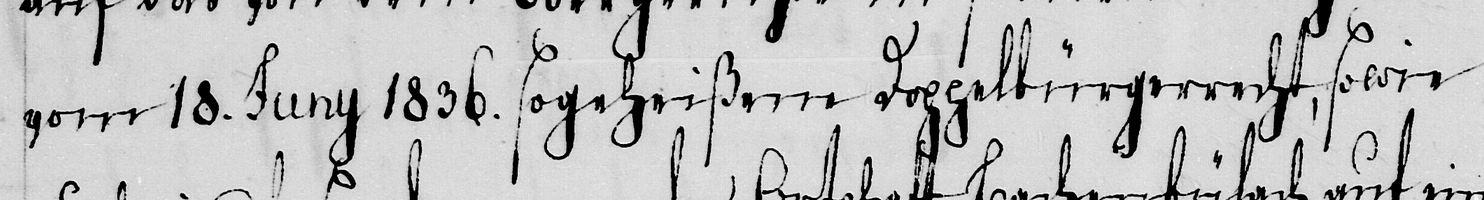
vom 18. Juny 1836. sogeheißene Doppelbürgerrecht, sowie
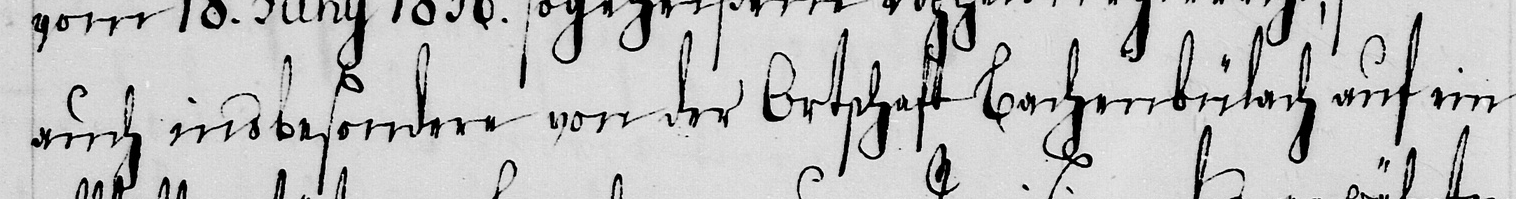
auch insbesondere von der Ortschaft Bachenbülach auf ein
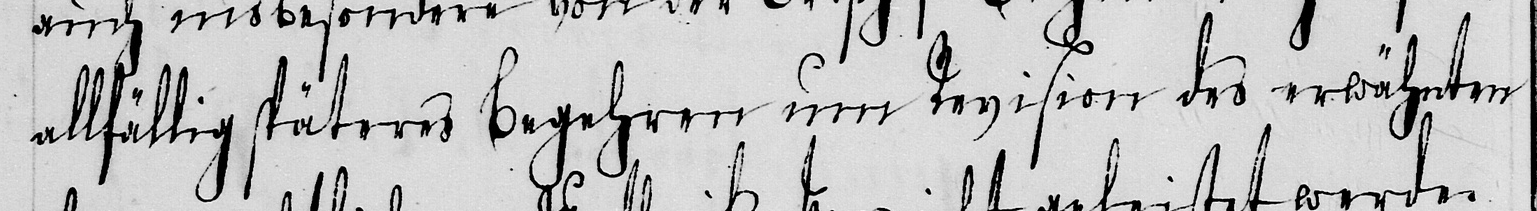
allfällig späteres Begehren um Revision des erwähnten
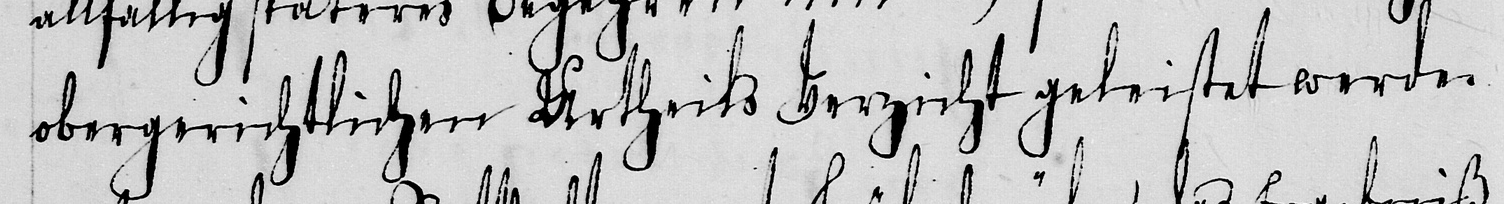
obergerichtlichen Urtheils Verzicht geleistet werde.
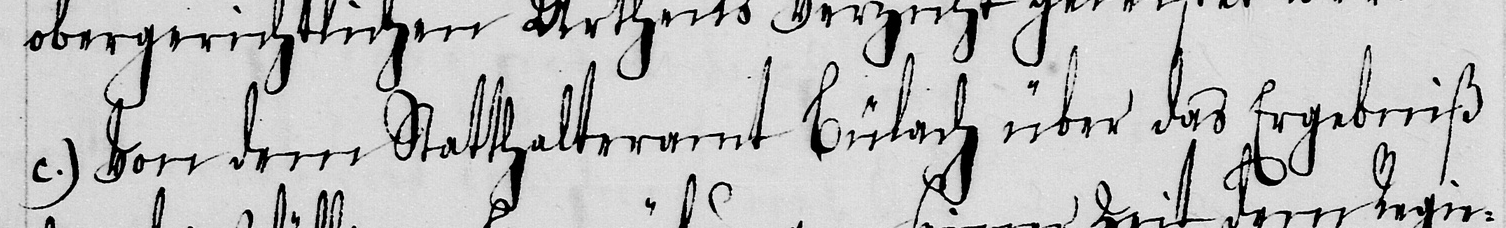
c.) Von dem Statthalteramt Bülach über das Ergebniß
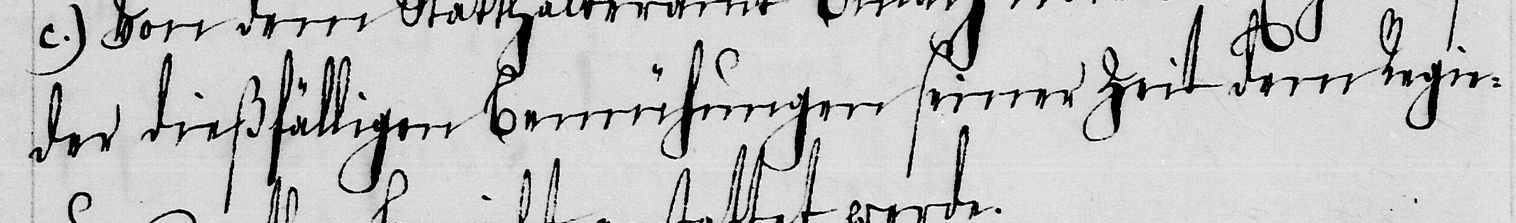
der dießfälligen Bemühungen seiner Zeit dem Regie¬
